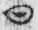日
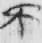不
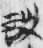○（察）
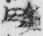○（陳）
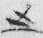之
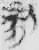傷
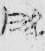阩
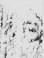門
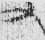又（有）
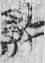敗
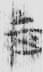正
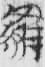羅
